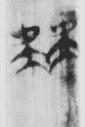{㣇㣇}
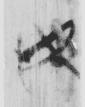女
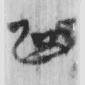𠀠
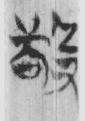敬
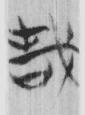哉
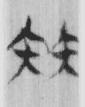{矢矢}
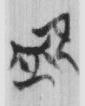卹
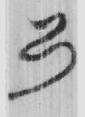乃
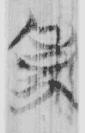事
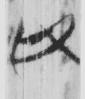女
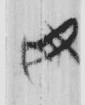母
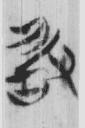敢
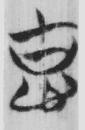怙
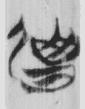偈
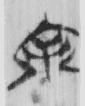余
